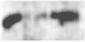一
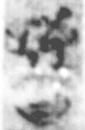晉
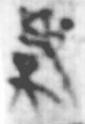杸
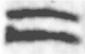二
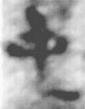屯
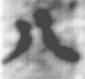八
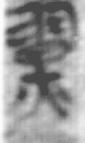翼
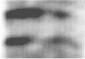二
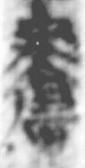○（畫）
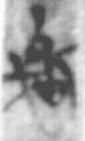○（伐）
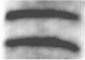二
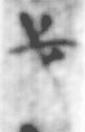戈
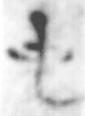屯
